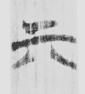亓
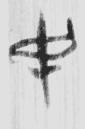民
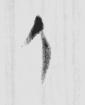人
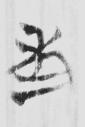老
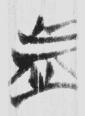者
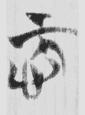{元心}
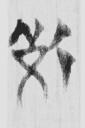死
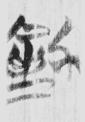{倉力}
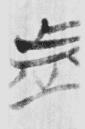者
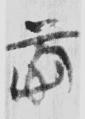{元心}
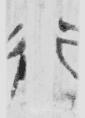行
